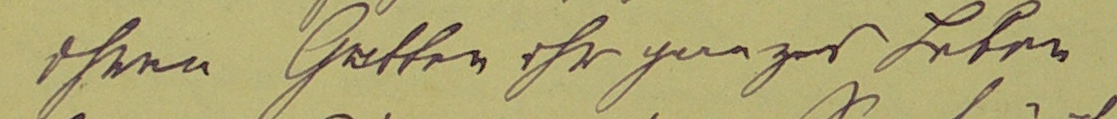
ihren Gatten ihr ganzes Leben
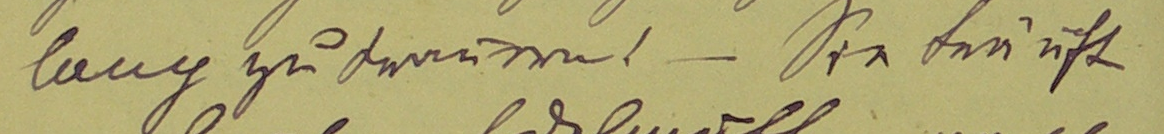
zu Trauern ! - Sie träuft
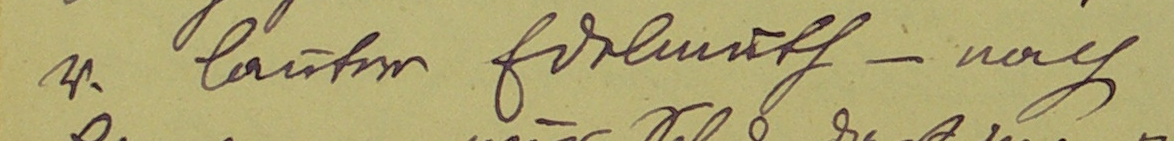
vor lauter Edelmut- nach
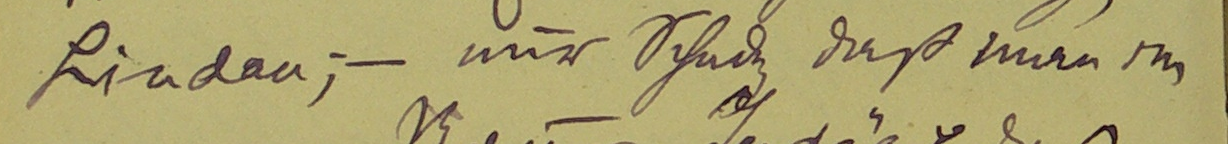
Lindau; -nur Schade daß man im
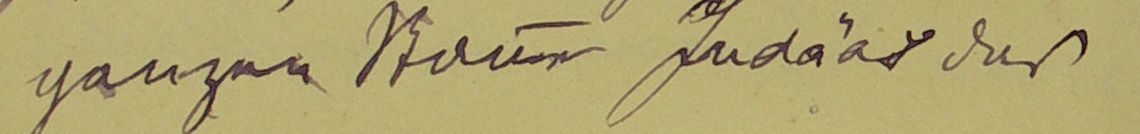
ganzen Stamm Judäer das
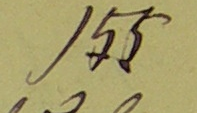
155
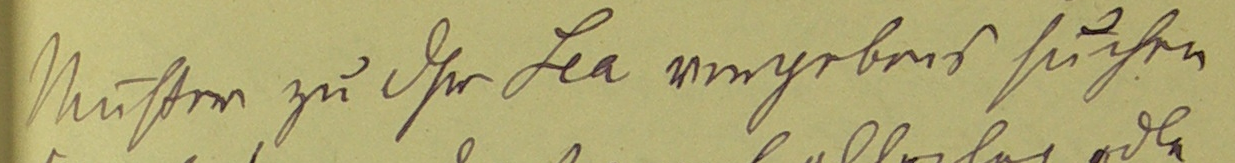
Muster zu dieser Lea vergebens suchen
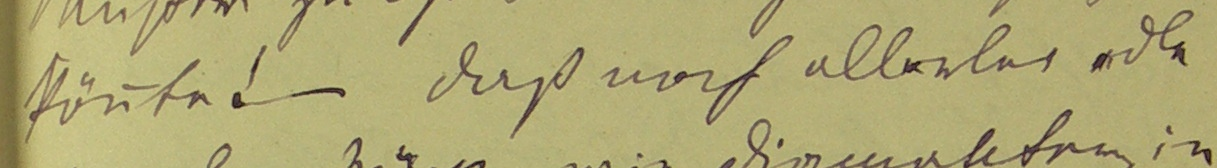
könnte;- daß nach allerlei edlen
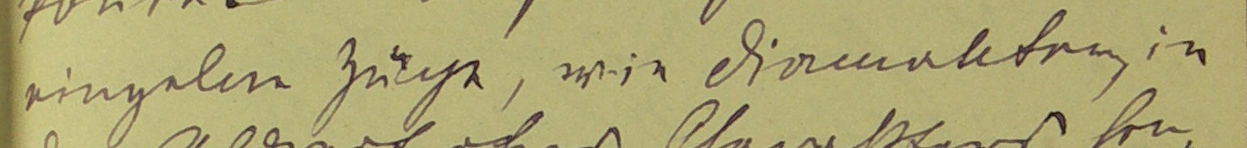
einzelnen Zügen, wie Diamenten in
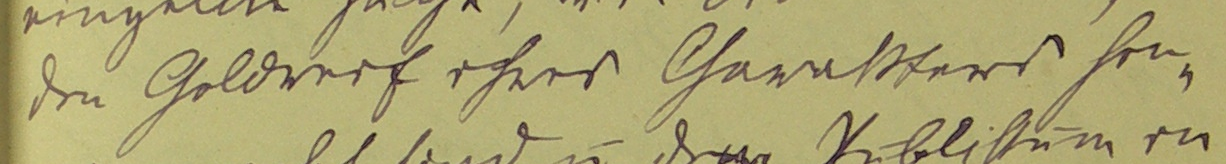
den Goldreif ihres Charakters hin¬
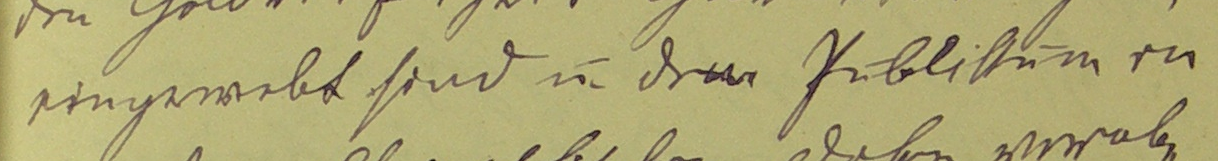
eingewebt sind und dem Publikum in
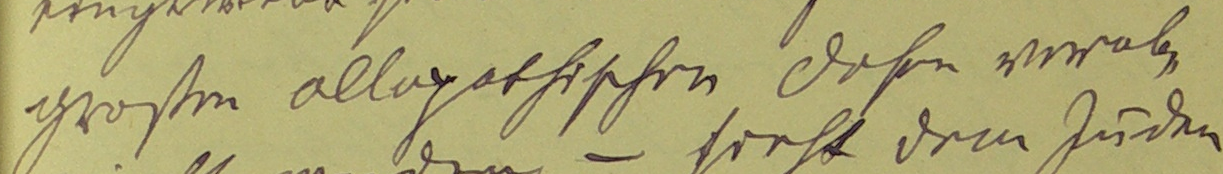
großen allegothischen Dosen verab¬
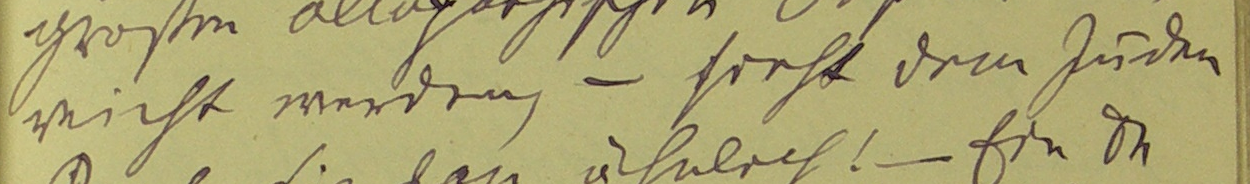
reicht werden.—sieht dem Juden
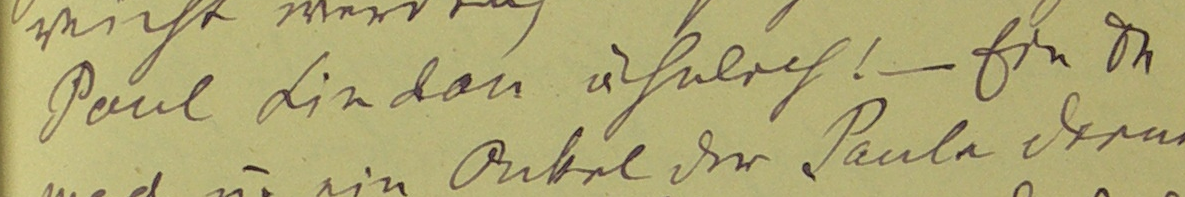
Paul Lindau ähnlich. -Ein Dr.
